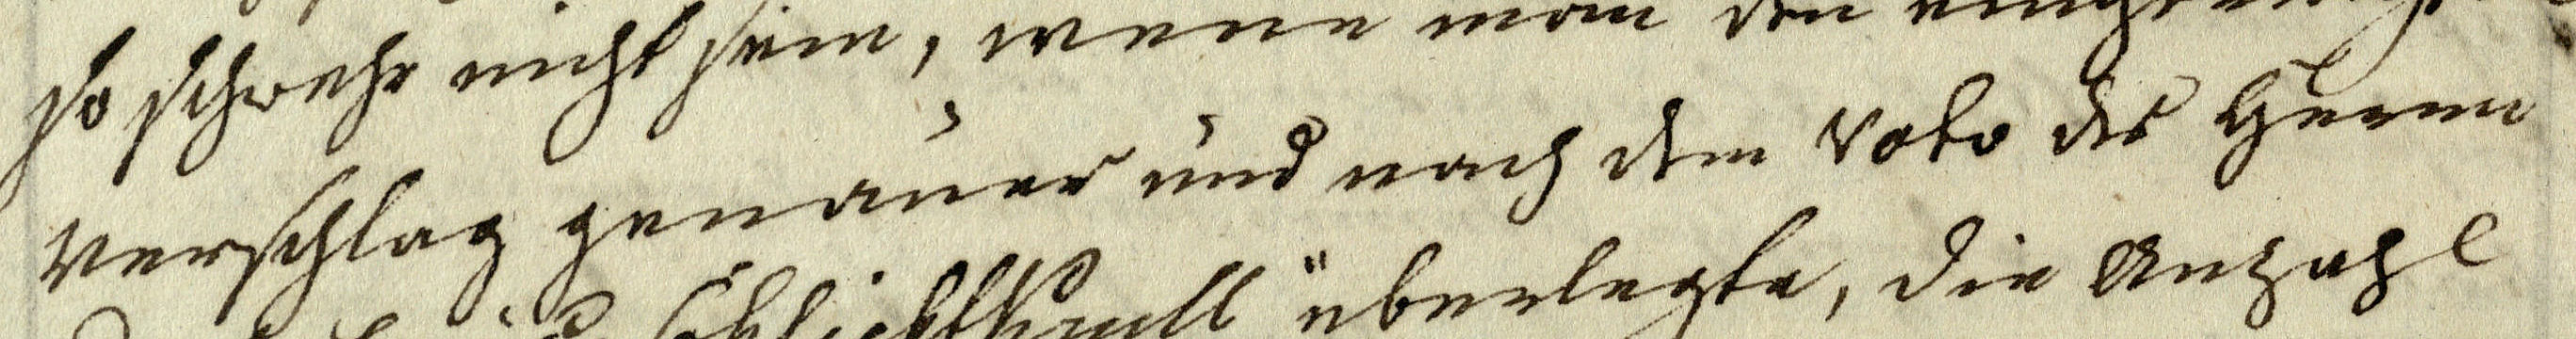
Verschlag genauer und nach dem voto des Herrn
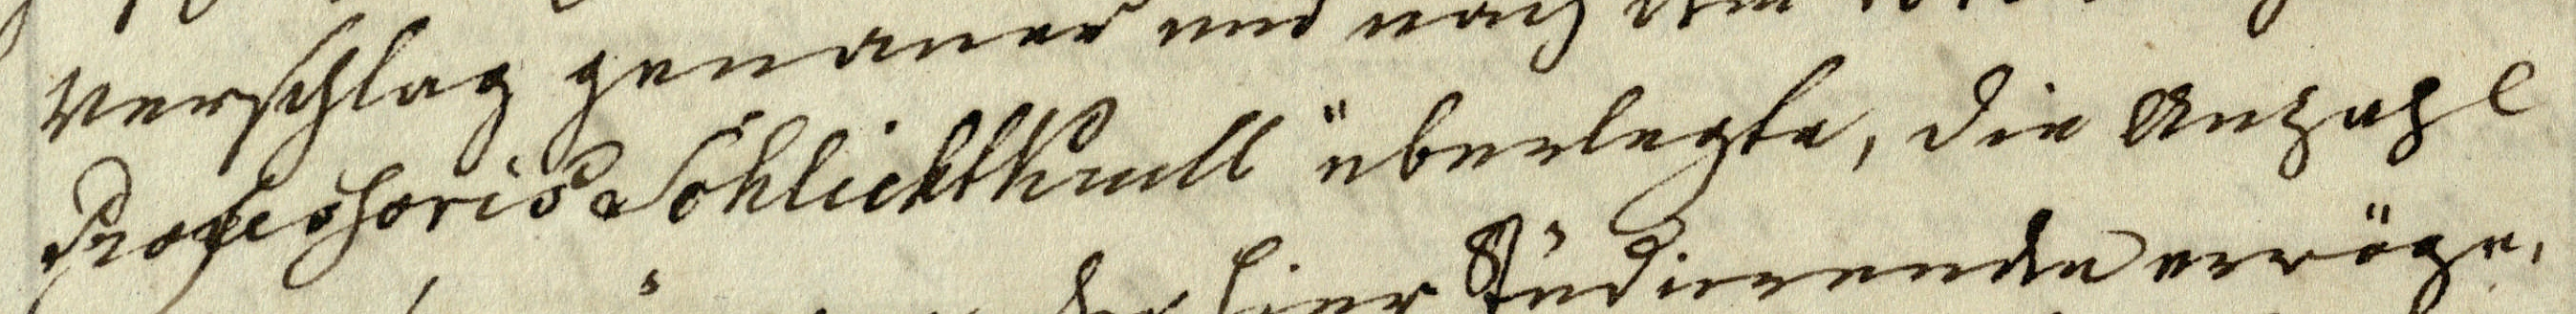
Professoris Schlichtkrull überlegte, die Anzahl
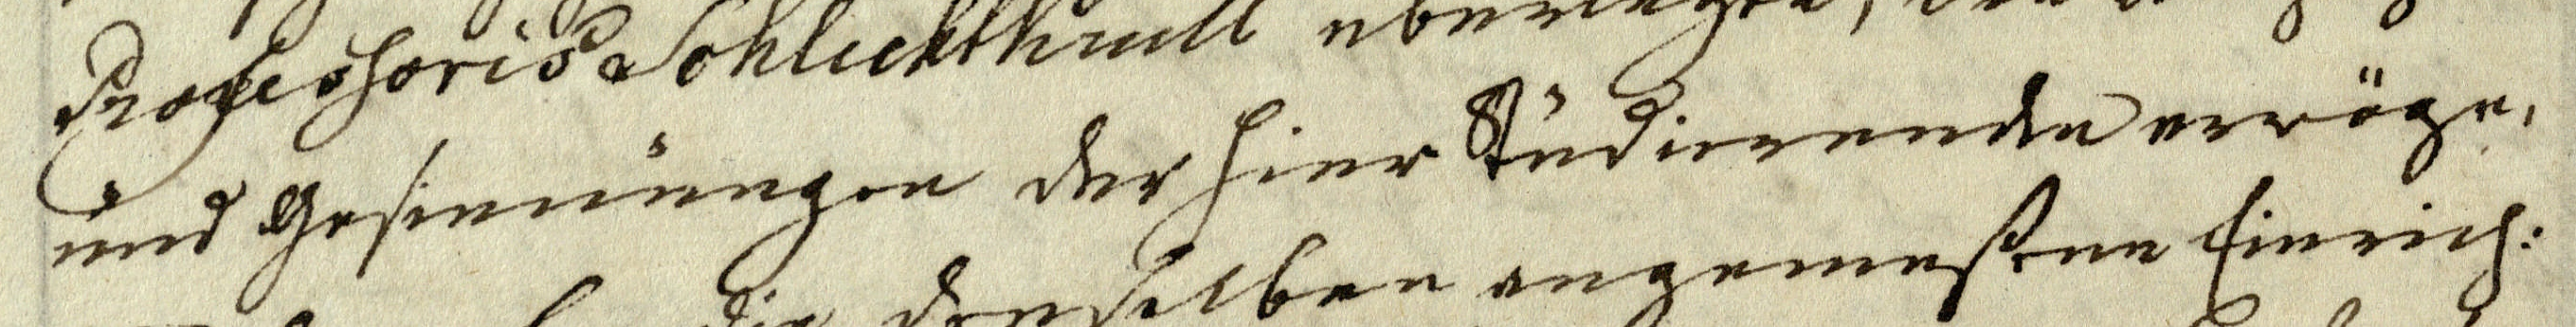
und Gesinnungen der hier Studierenden erwöge,
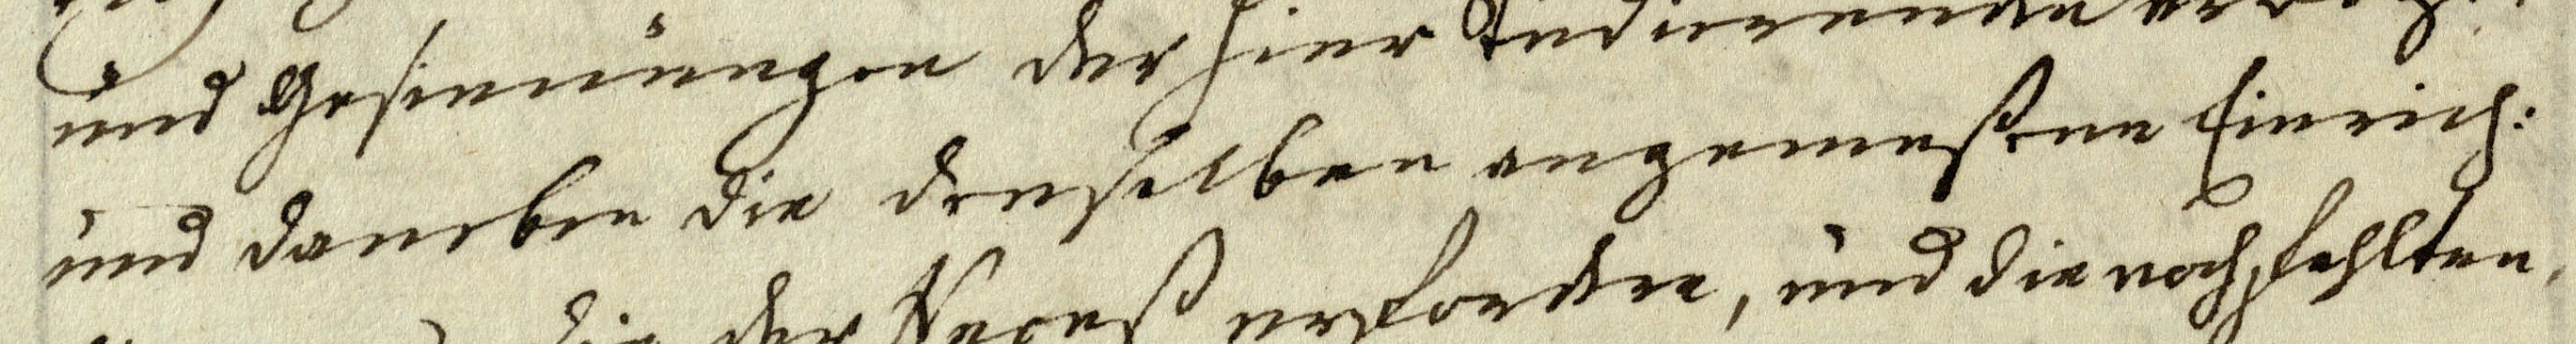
und daneben die denselben angemeßene Einrich¬
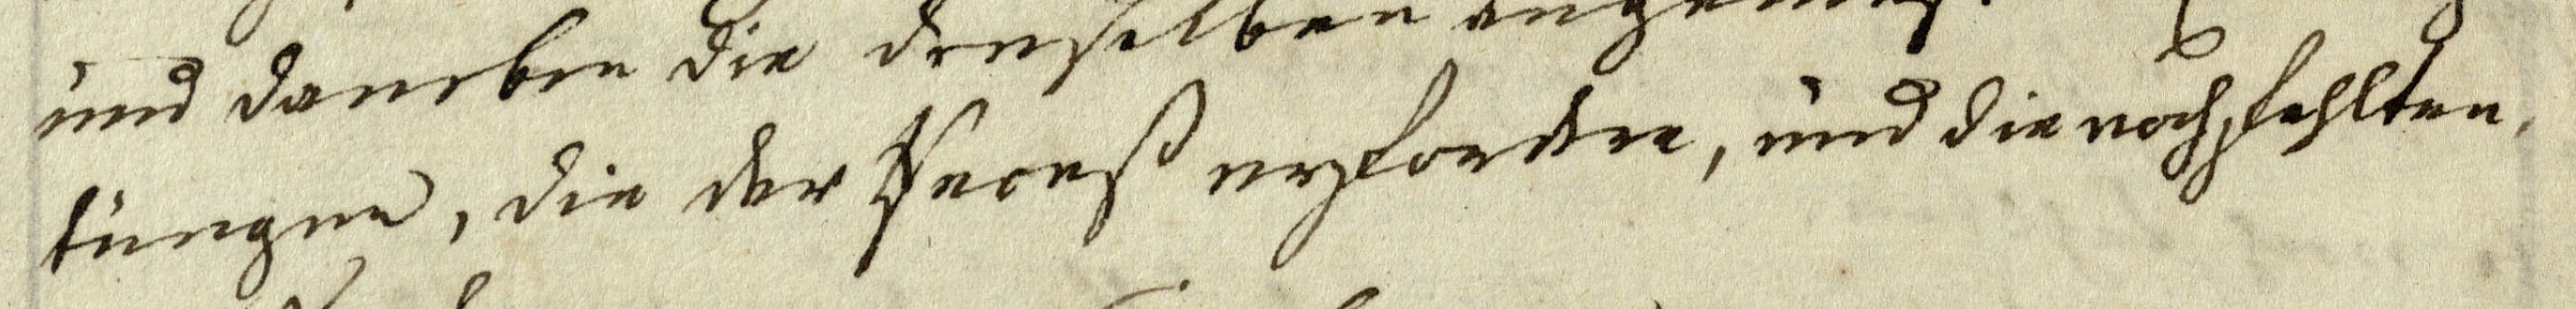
tungen, die der Receß erfordere, und die noch fehlten,
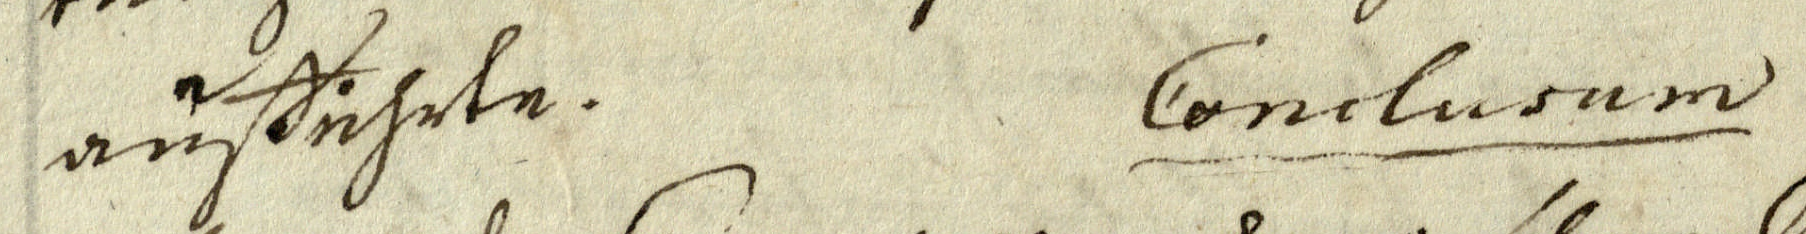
aufführte. Conclusum
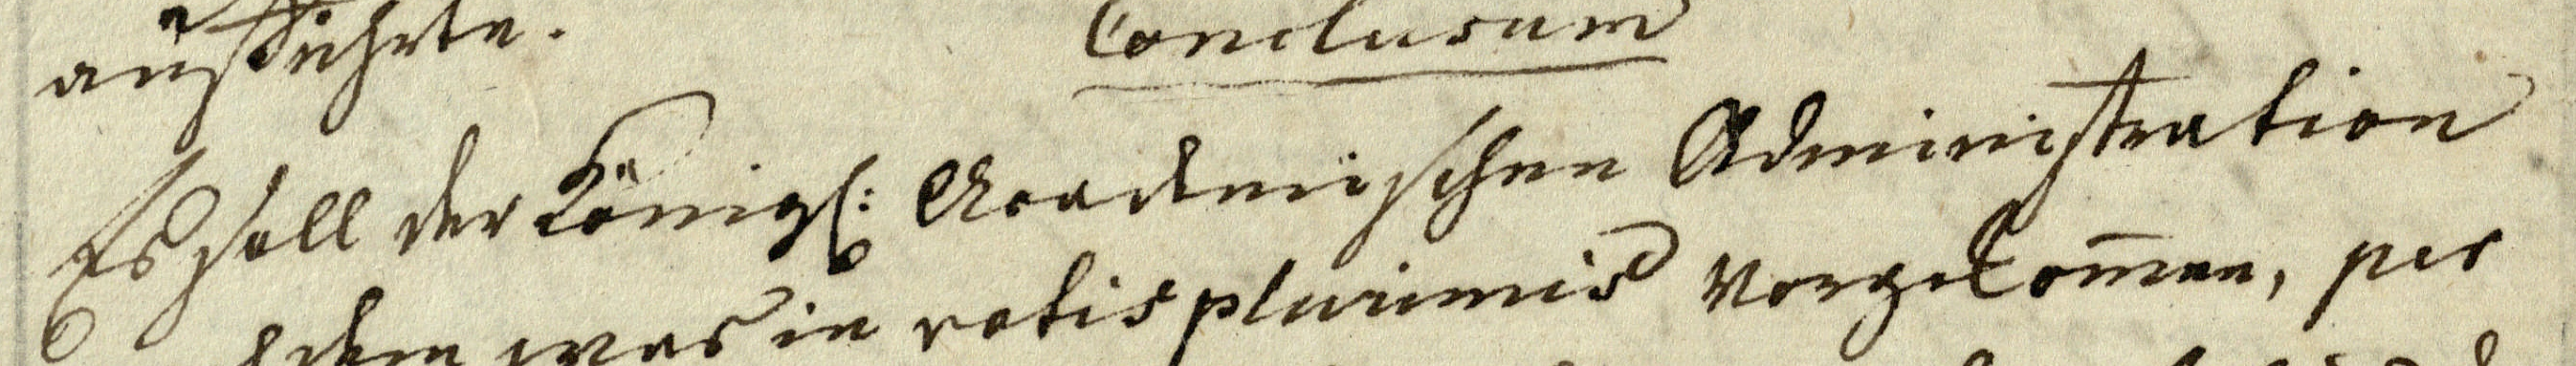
Es soll der Königl. Academischen Administration
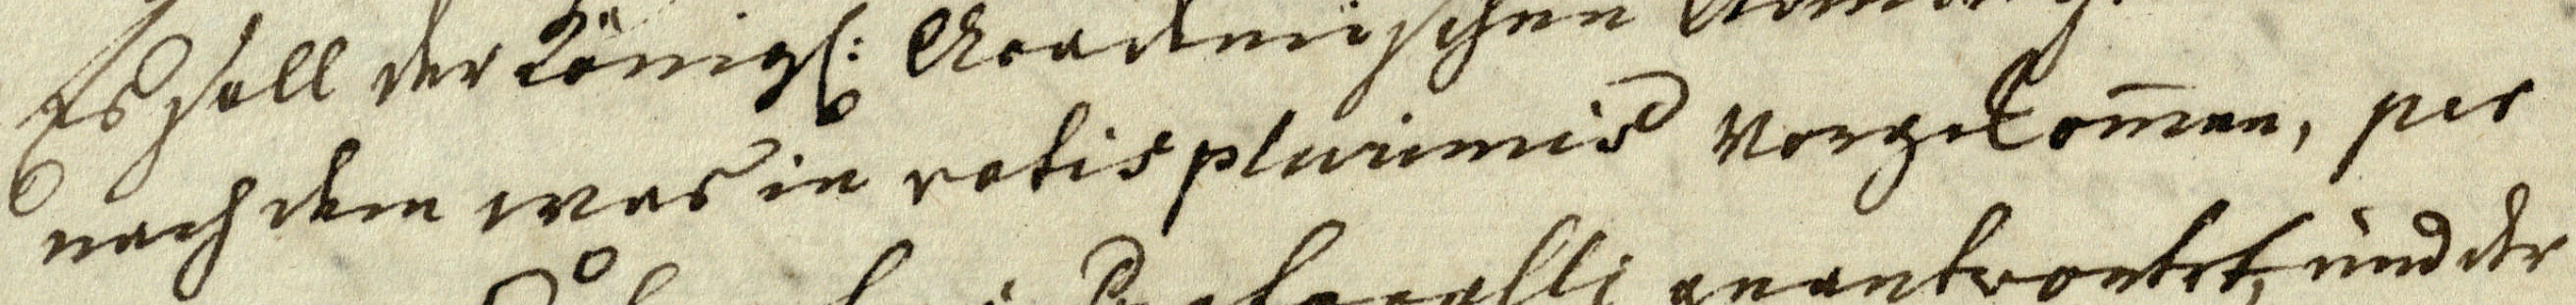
nach dem was in votis plurimis vorgekomen, per
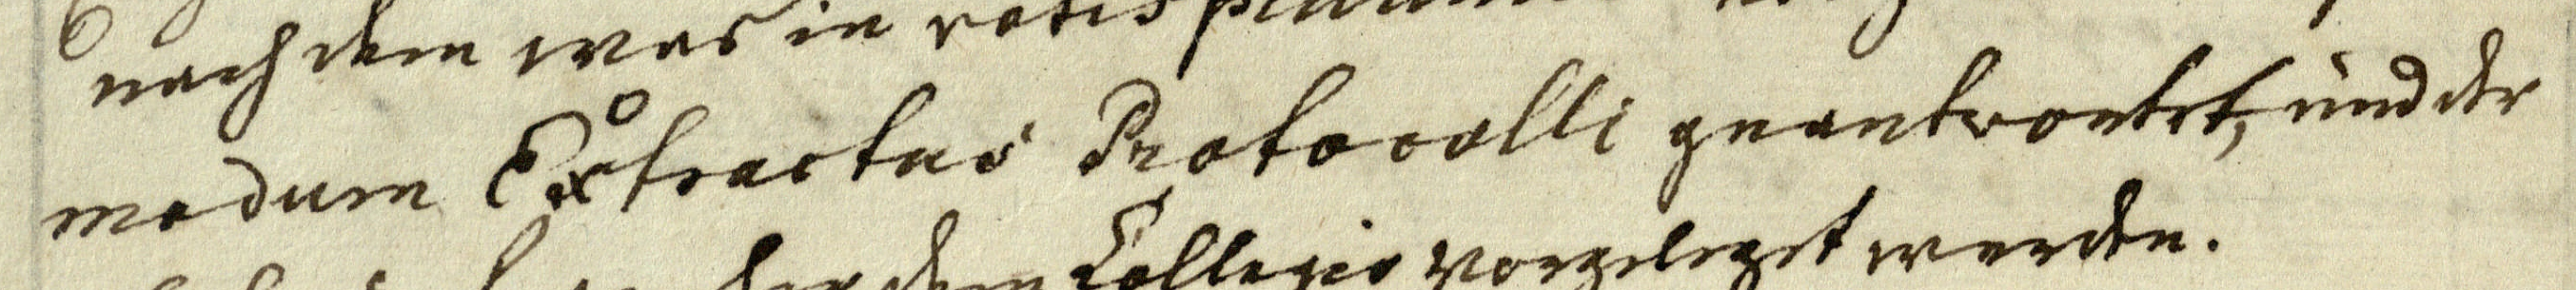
modum Extractus Protocolli geantwortet, und der
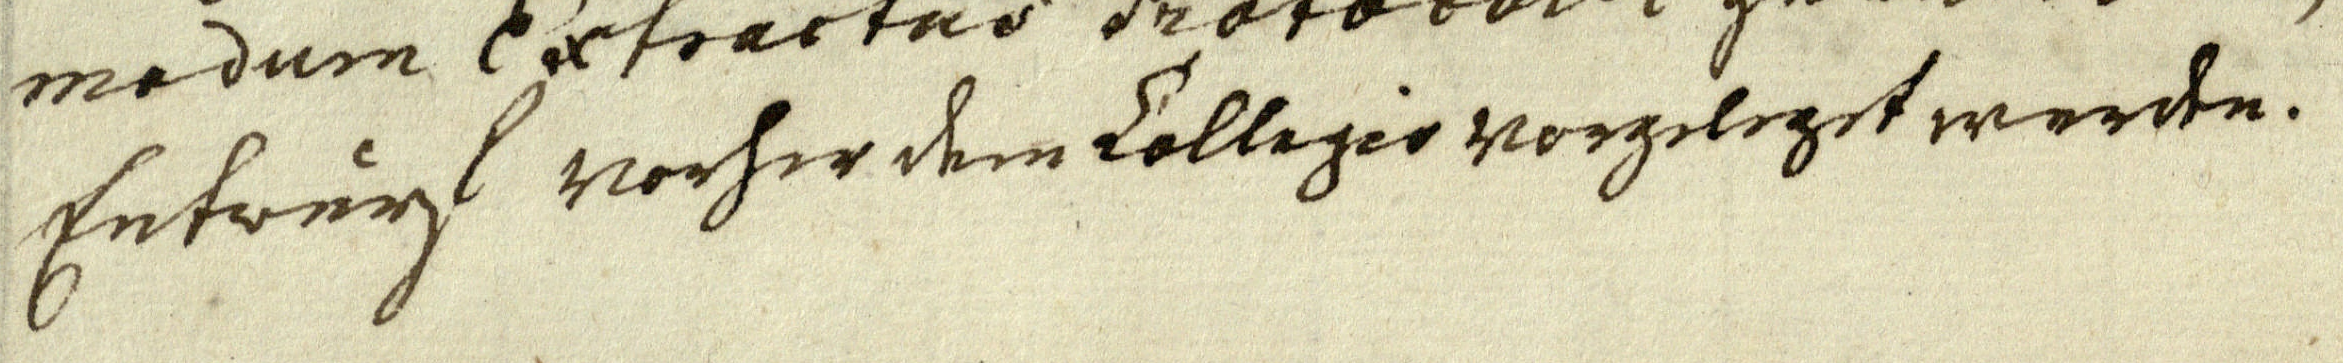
Entwurf vorher dem Collegio vorgeleget werden.
